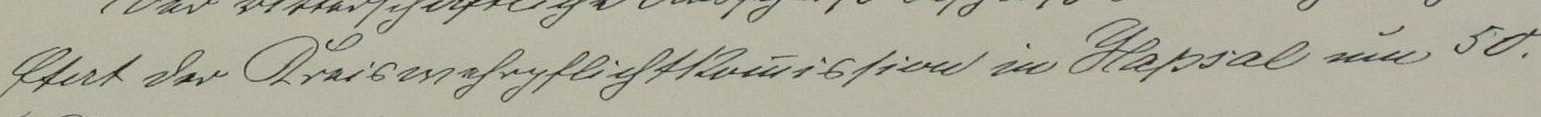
Etat der Kreiswehrpflichtkommission in Hapsal um 50.
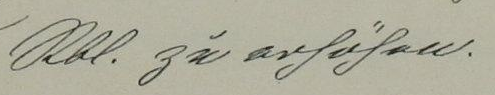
Rbl. zu erhöhen.
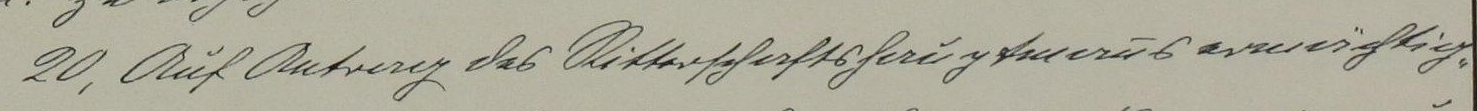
20. Auf Antrag des Ritterschaftshauptmanns ermächtig-
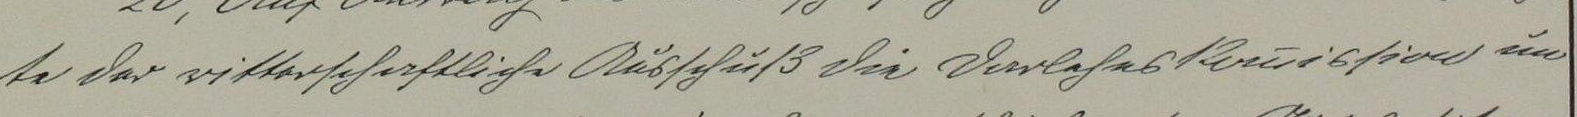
te der ritterschaftliche Ausschuß die Darlehnskommission un-
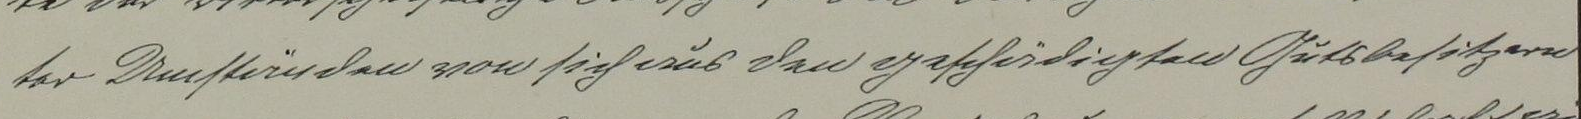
ter Umständen von sich aus den geschädigten Gutsbesitzern
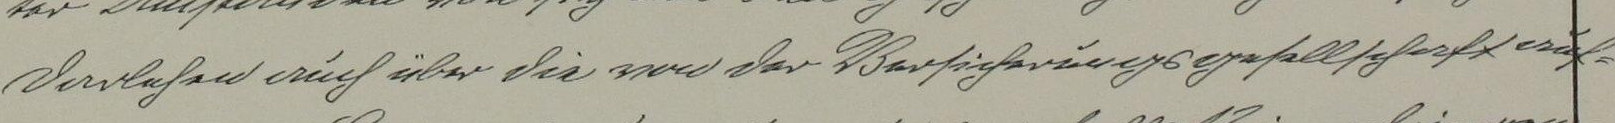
Darlehen auch über die von der Versicherungsgesellschaft auf-
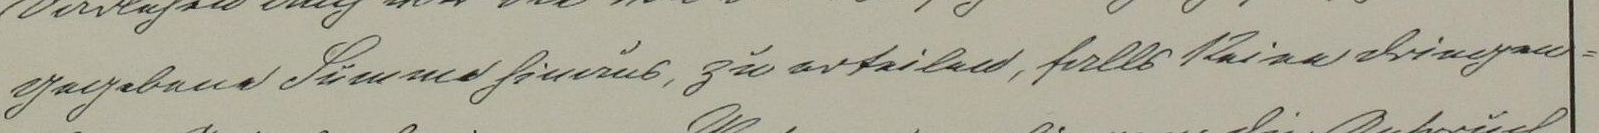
gegebene Summe hinaus, zu erteilen, falls keine dringen-
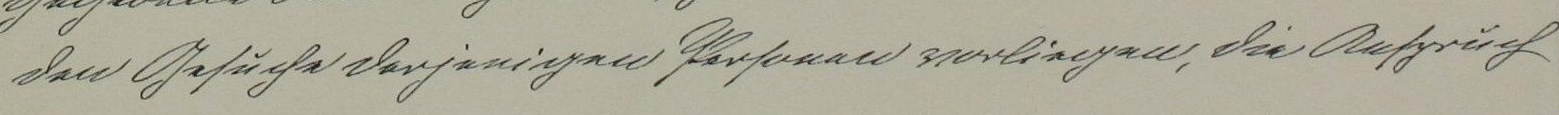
den Gesuche derjenigen Personen vorliegen, die Anspruch
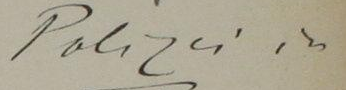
Polizei in
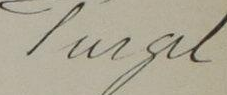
Turgel
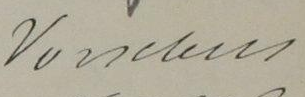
Vorschuss
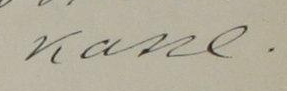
kasse
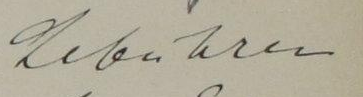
Gebühren
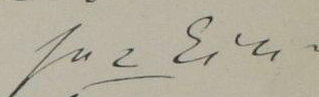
für Ein-
